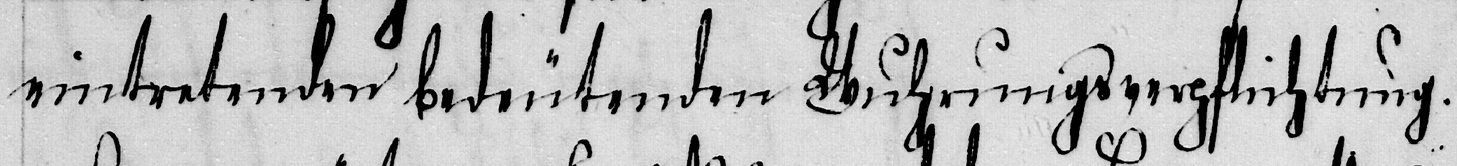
eintretenden bedeutenden Wuhrungsverpflichtung.
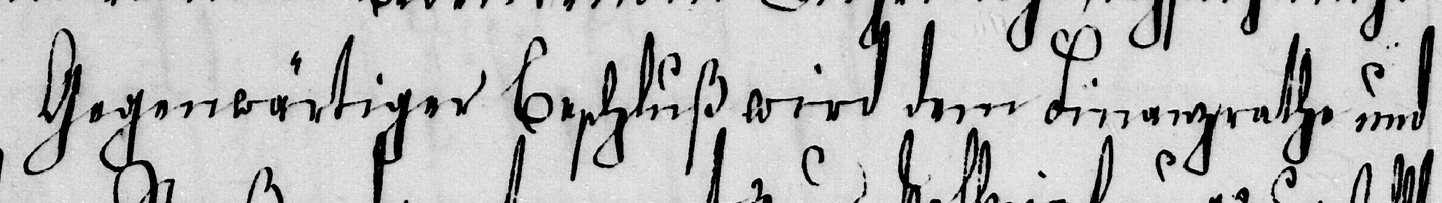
Gegenwärtiger Beschluß wird dem Finanzrathe und
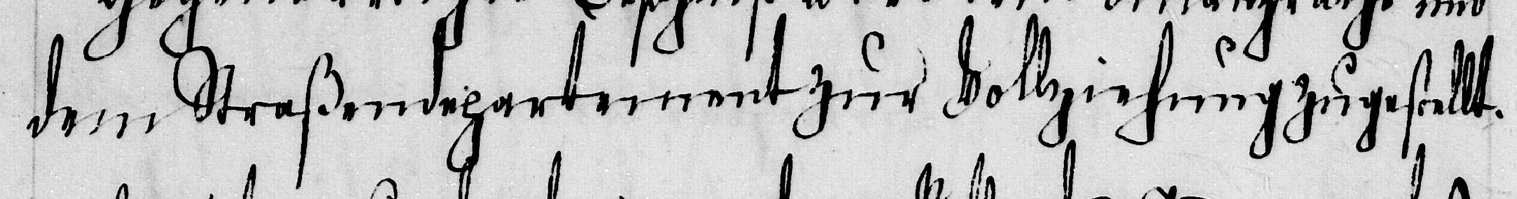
dem Straßendepartement zur Vollziehung zugestell¬
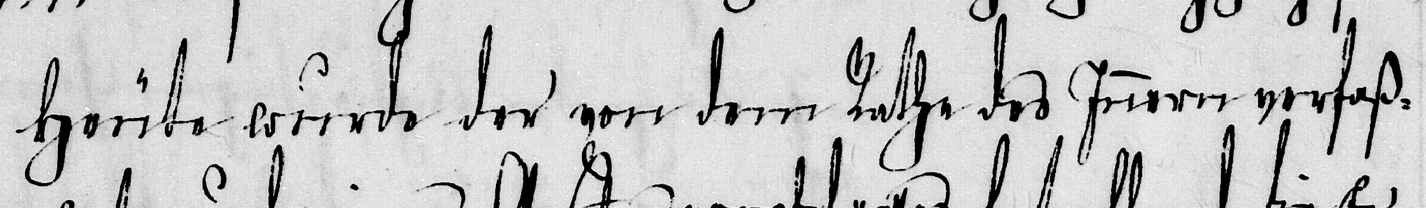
Heute wurde der von dem Rathe des Innern verfaß¬
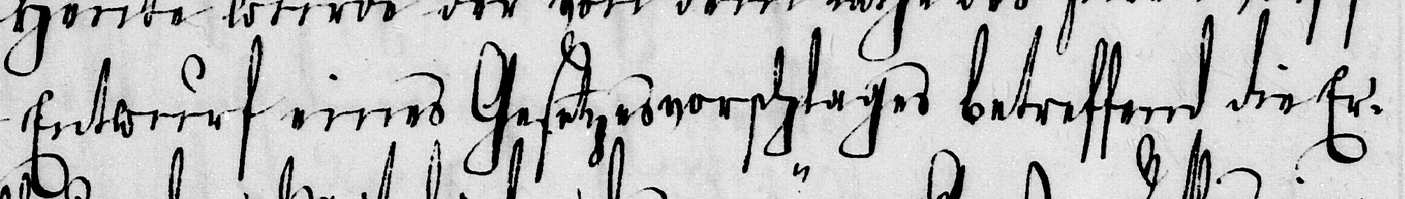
Entwurf eines Gesetzesvorschlages betreffend die Er¬
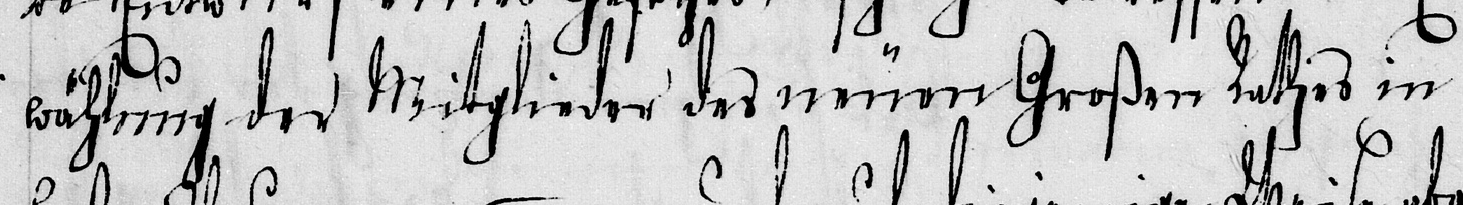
wählung der Mitglieder des neuen Großen Rathes in
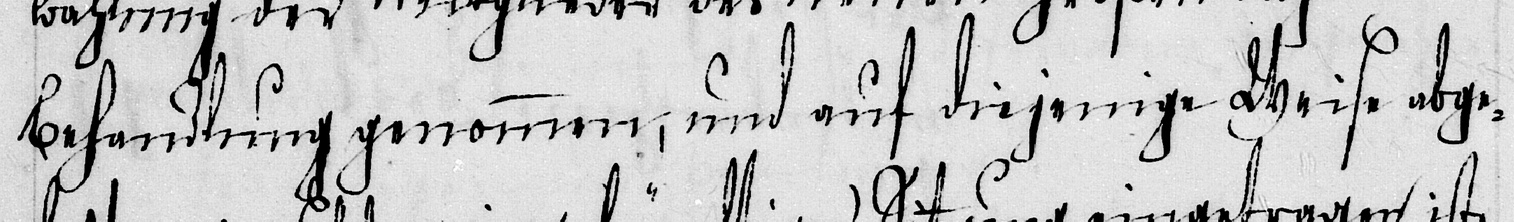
Behandlung genommen, und auf diejenige Weise abge¬
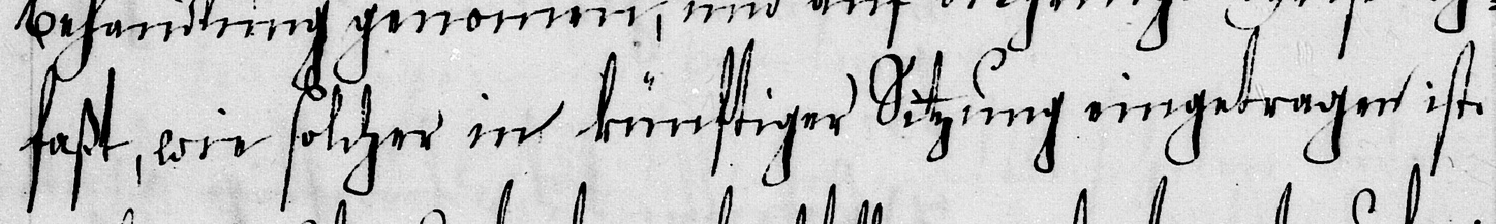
faßt, wie solcher in künftiger Sitzung eingetragen ist.
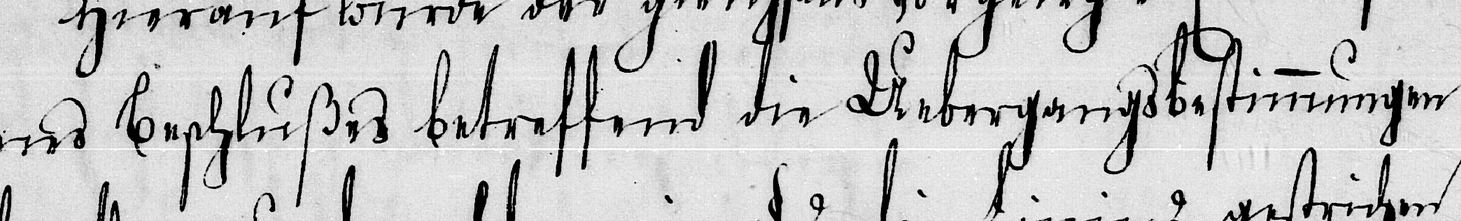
nes Beschlußes betreffend die Uebergangsbestimmungen
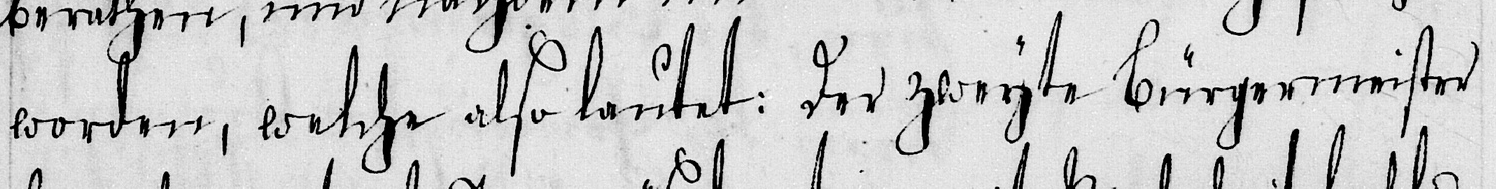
worden, welche also lautet: Der zweyte Bürgermeister
